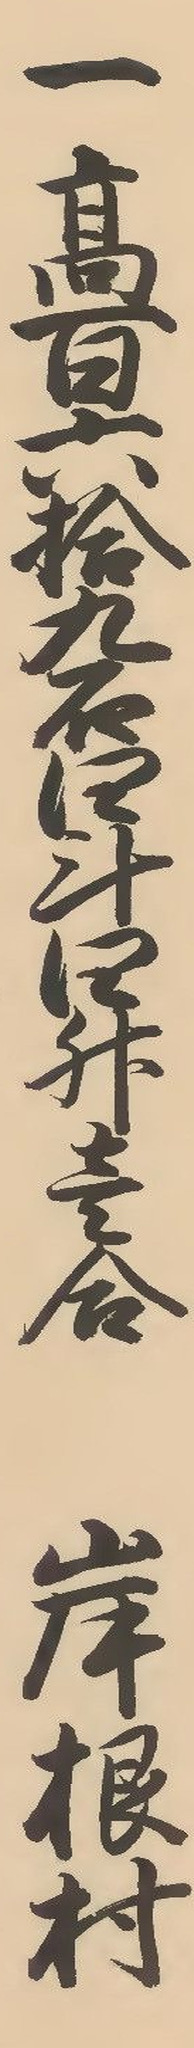一高百六拾九石四斗四升壱合岸根村
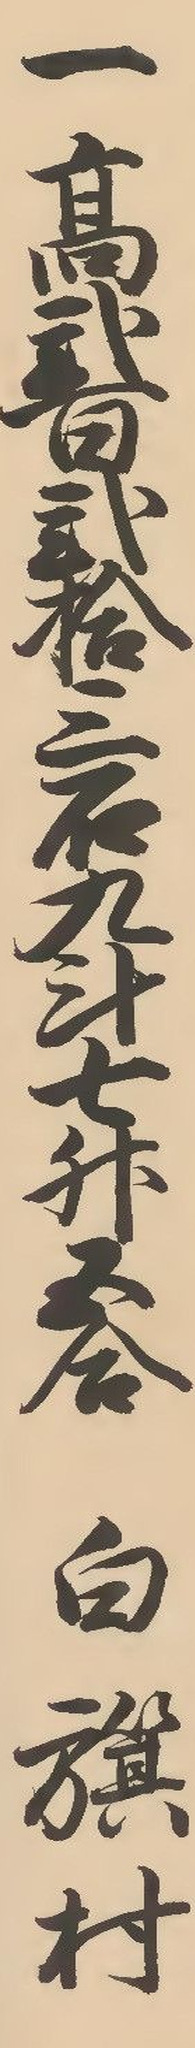一高弐百弐拾三石九斗七升五合白旗村
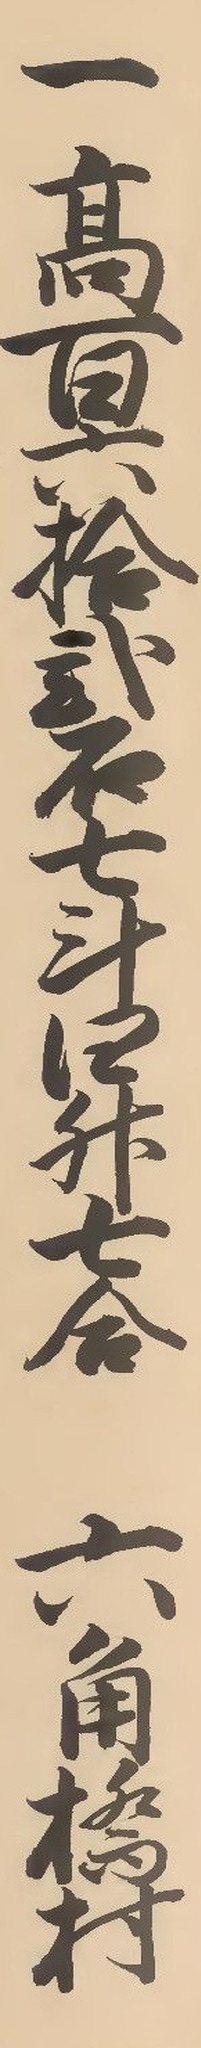一高百六拾弐石七斗四升七合六角橋村
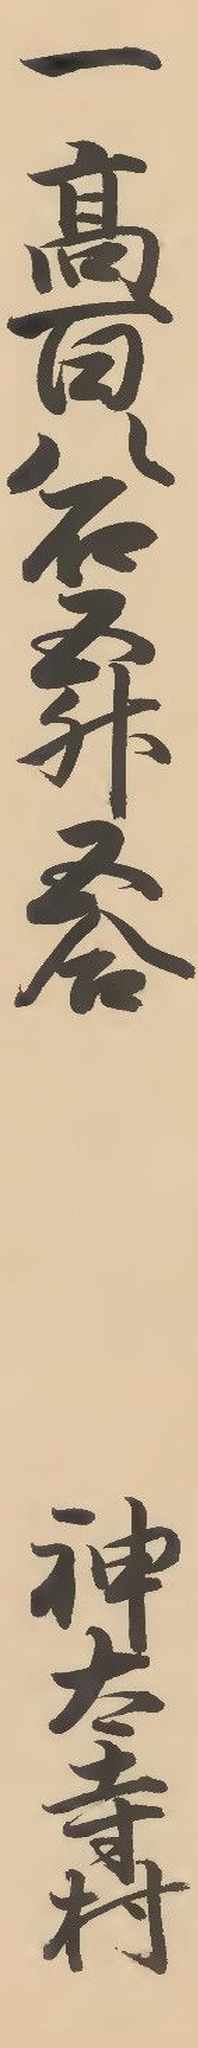一高百八石五升五合神太寺村
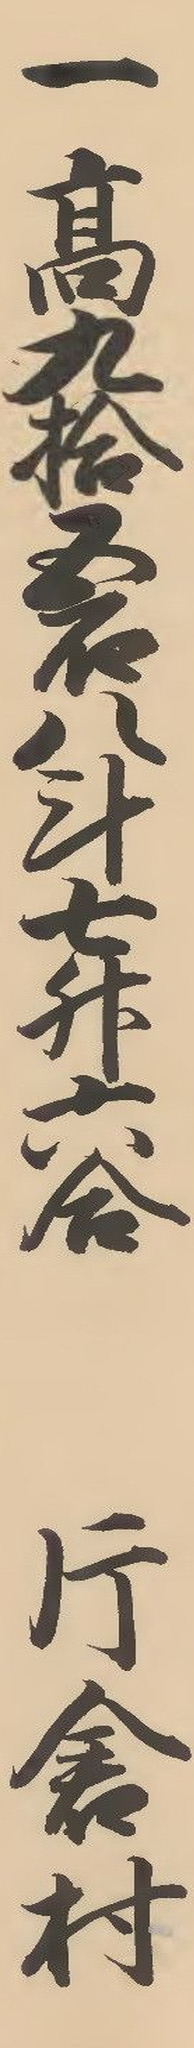一高九拾五石八斗七升六合片倉村
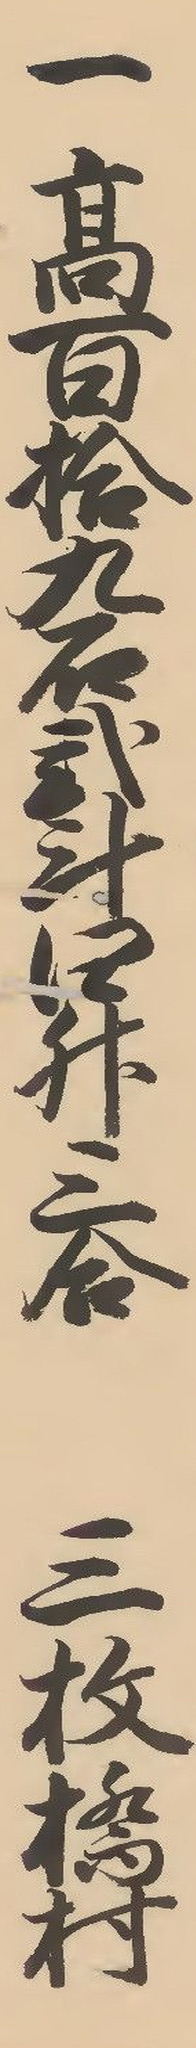一高百拾九石弐斗四升三合三枚橋村

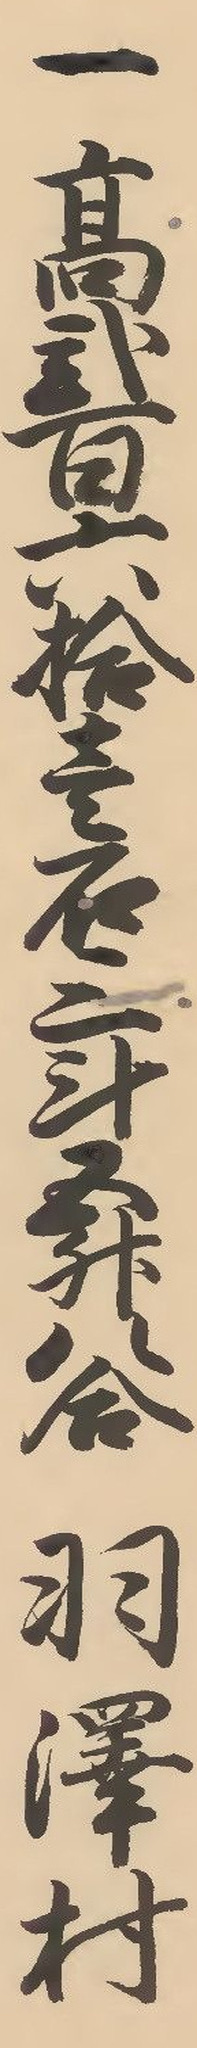一高弐百六拾壱石三斗五升八合羽澤村
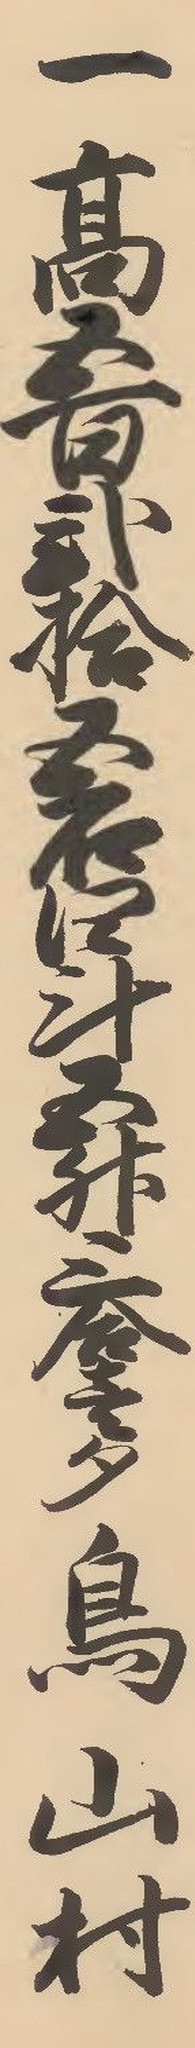一高五百弐拾五石四斗五升三合壱勺鳥山村
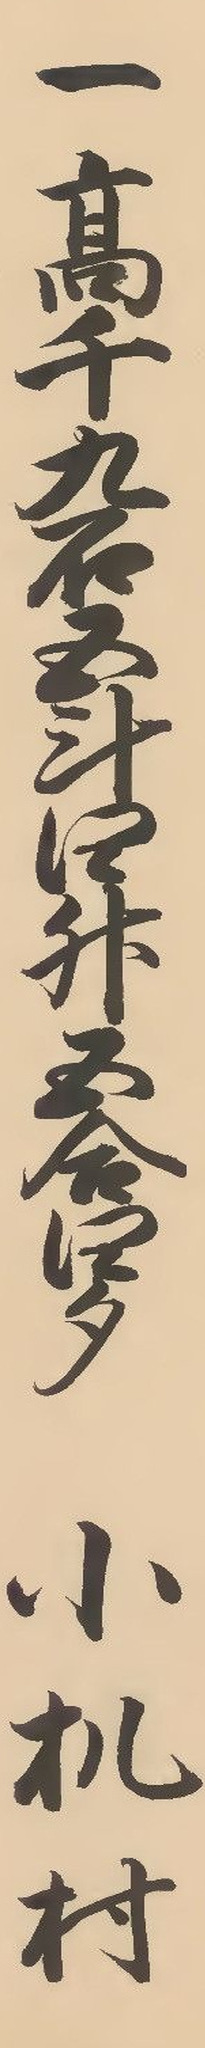一高千九石五斗四升五合四勺小机村
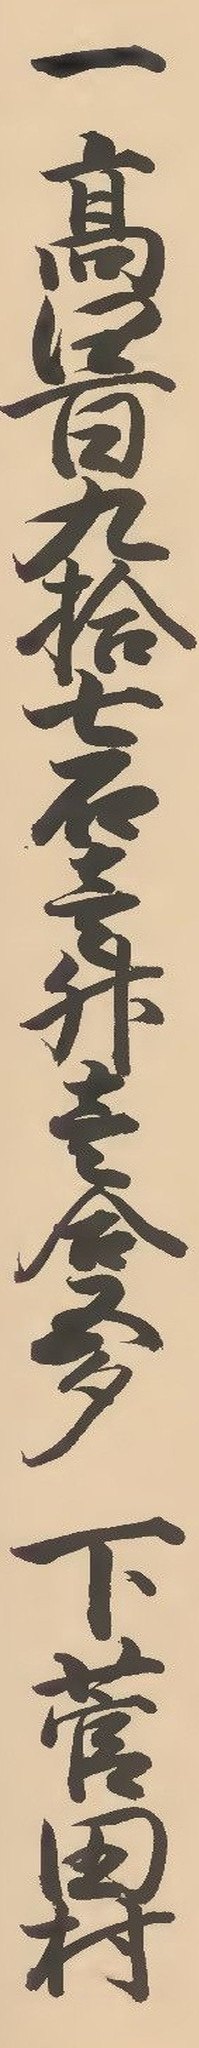一高四百九拾七石壱升壱合五勺下菅田村
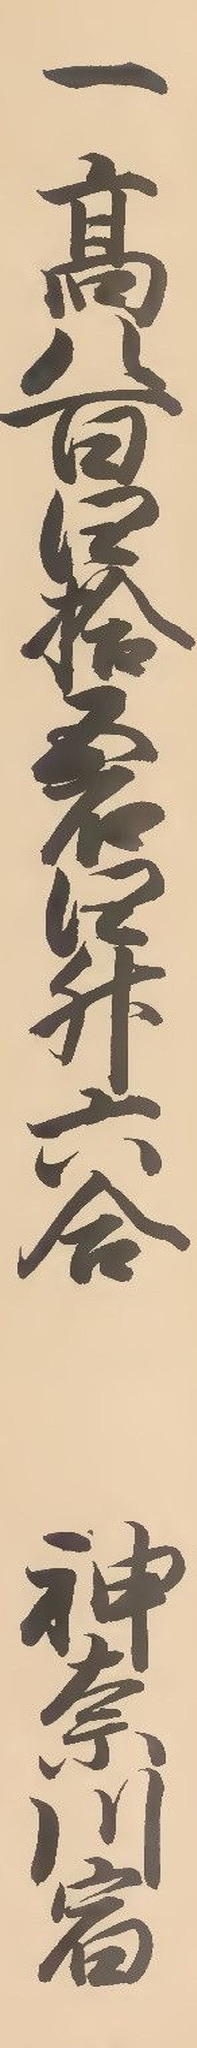一高八百四拾五石四升六合神奈川宿
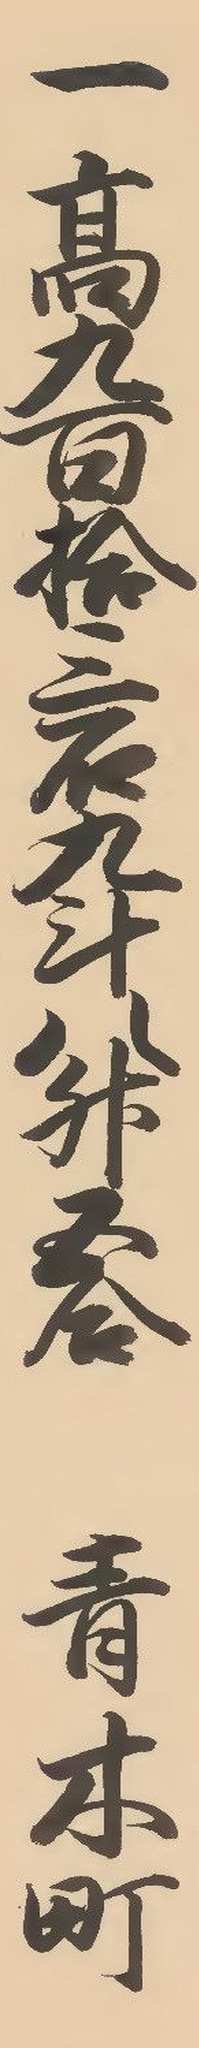一高九百拾三石九斗八升五合青木町
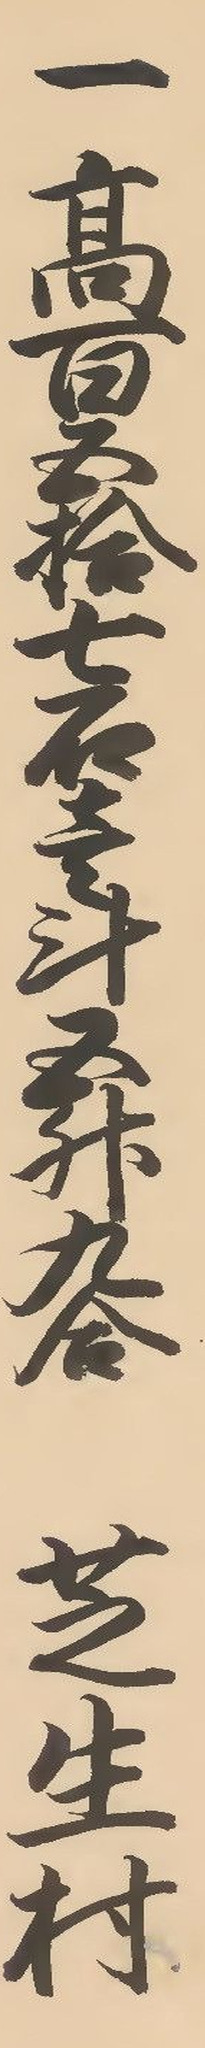一高百五拾七石壱斗五升九合芝生村
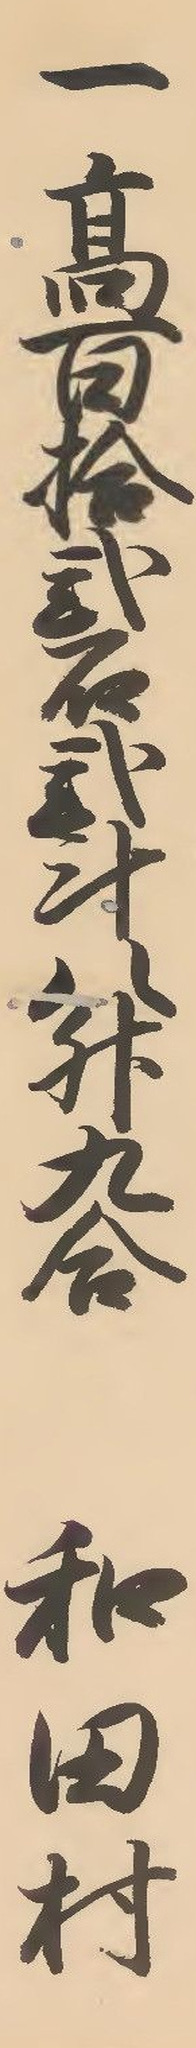一高百拾弐石弐斗八升九合和田村

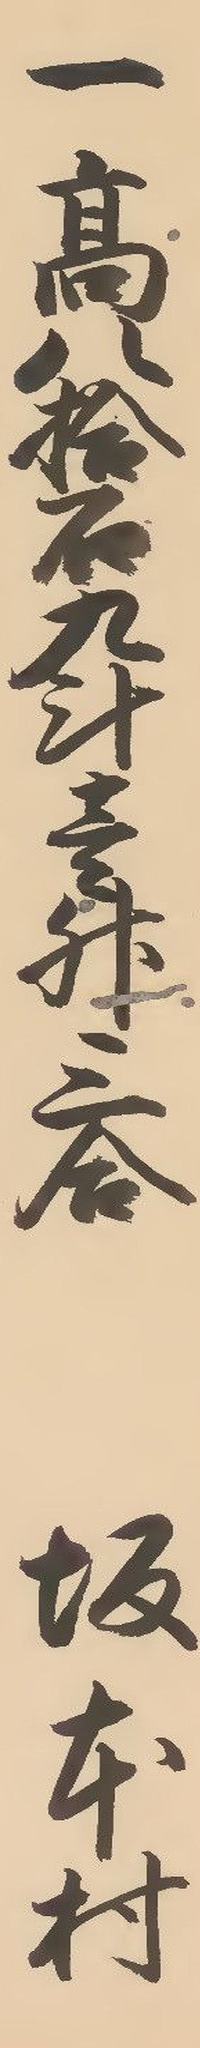一高八拾石九斗壱升三合坂本村
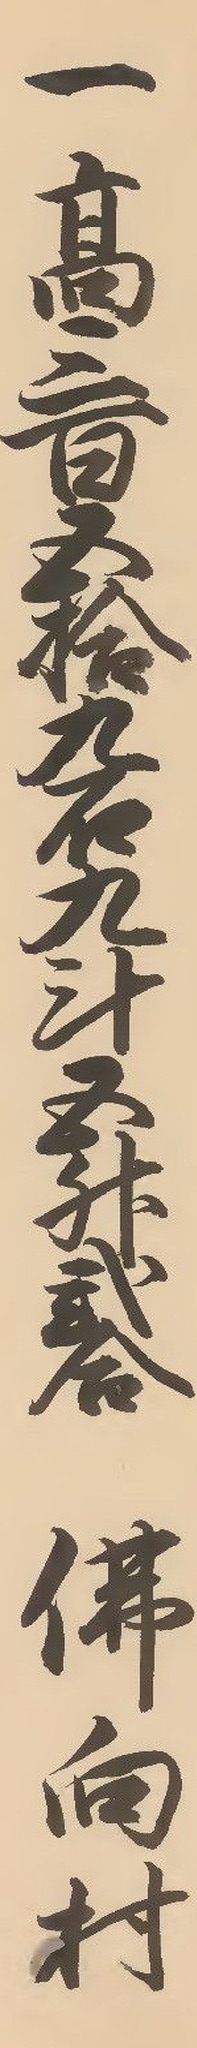一高三百五拾九石九斗五升弐合仏向村
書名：武蔵国郷帳　上
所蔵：国立公文書館 National Archives of Japan
